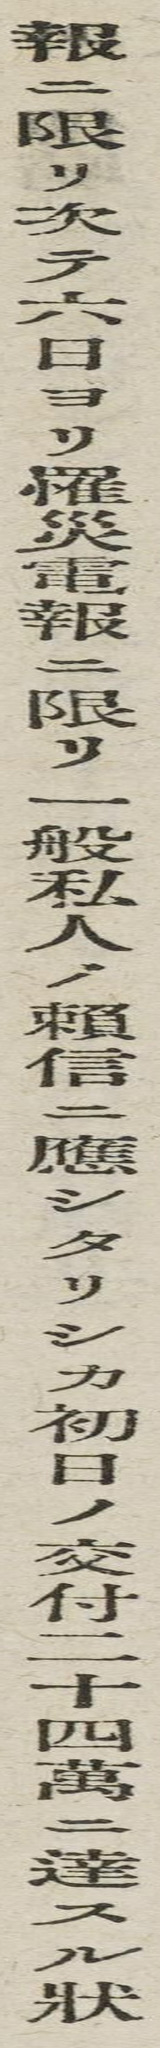報ニ限リ次テ六日ヨリ罹災電報ニ限リ一般私人ノ頼信ニ応シタリシカ初日ノ交付二十四万ニ達スル状
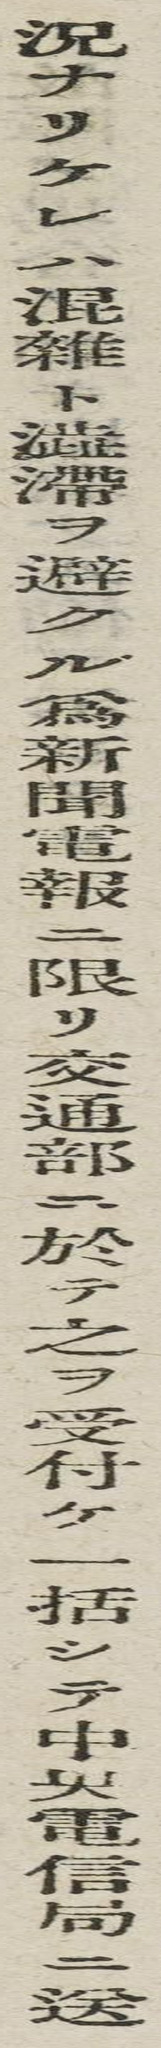況ナリケレハ混雑ト渋滞ヲ避クル為新聞電報ニ限リ交通部ニ於テ之ヲ受付ケ一括シテ中央電信局ニ送
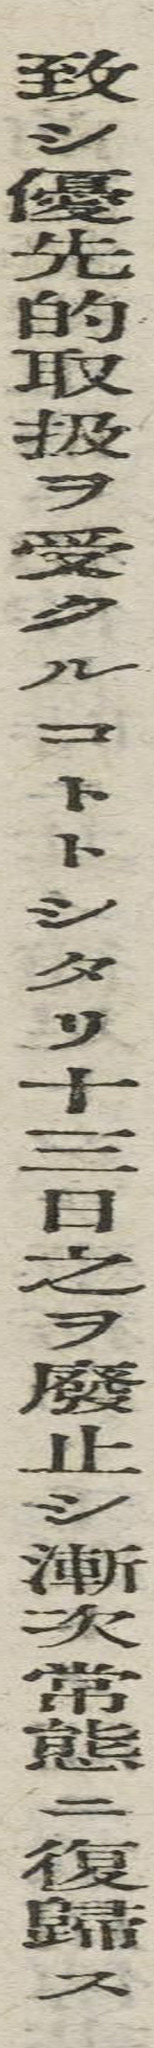致シ優先的取扱ヲ受クルコトトシタリ十三日之ヲ廃止シ漸次常態ニ復帰ス
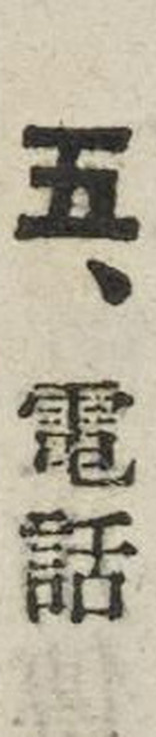五、電話
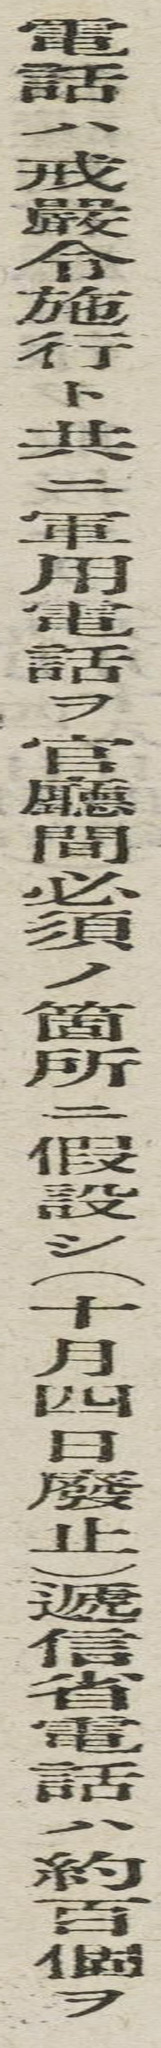電話ハ戒厳令施行ト共ニ軍用電話ヲ官庁間必須ノ箇所ニ仮設シ逓信省電話ハ約百個ヲ
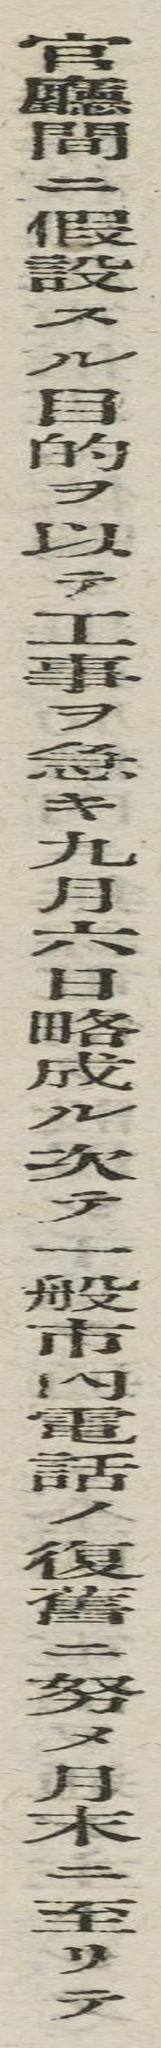官庁間ニ仮設スル目的ヲ以テ工事ヲ急キ九月六日略成ル次テ一般市内電話ノ復旧ニ努メ月末ニ至リテ
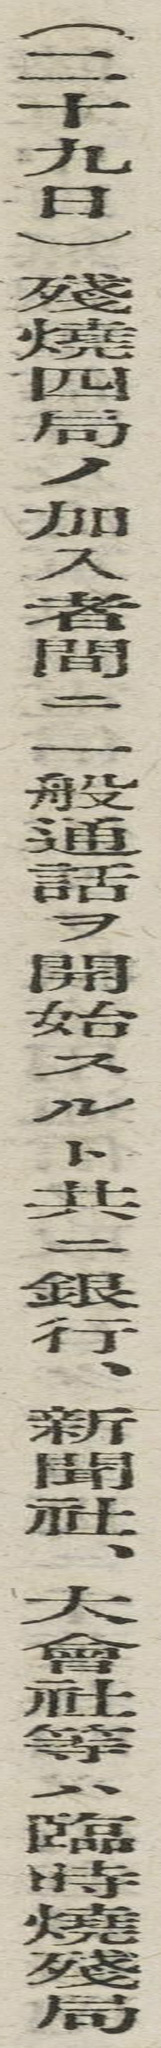残焼四局ノ加入者間ニ一般電話ヲ開始スルト共ニ銀行、新聞社、大会社等ハ臨時焼残局
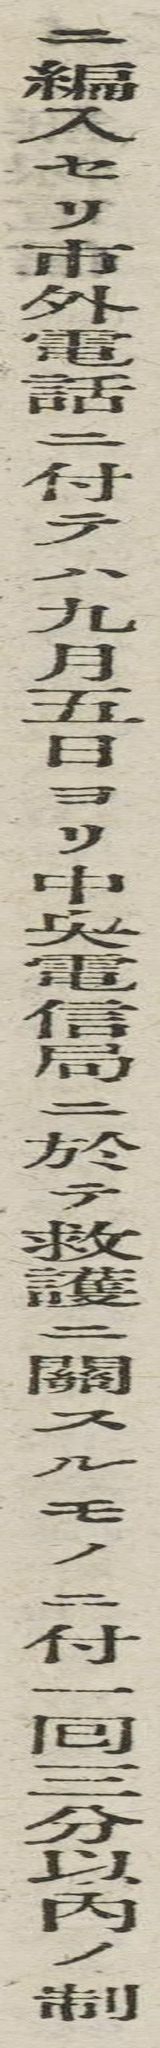ニ編入セリ市外電話ニ付テハ九月五日ヨリ中央電信局ニ於テ救護ニ関スルモノニ付一回三分以内ノ制
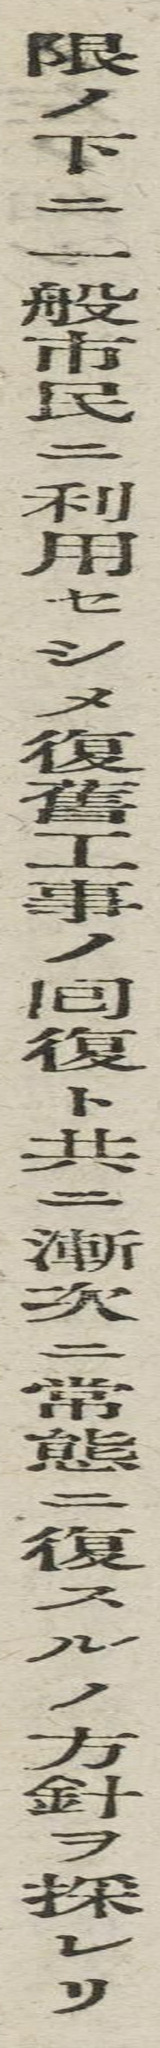限ノ下ニ一般市民ニ利用セシメ復旧工事ノ回復ト共ニ漸次ニ常態ニ復スルノ方針ヲ採レリ
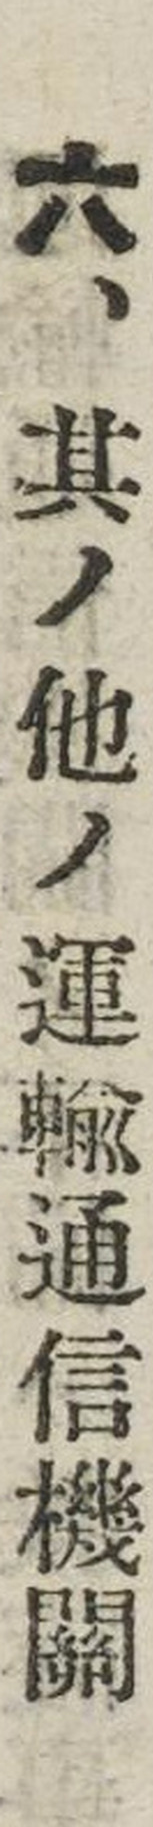六、其ノ他ノ運輸通信機関
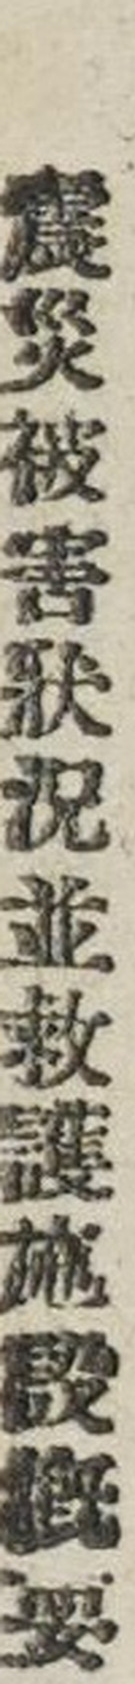震災被害状況並救護施設概要

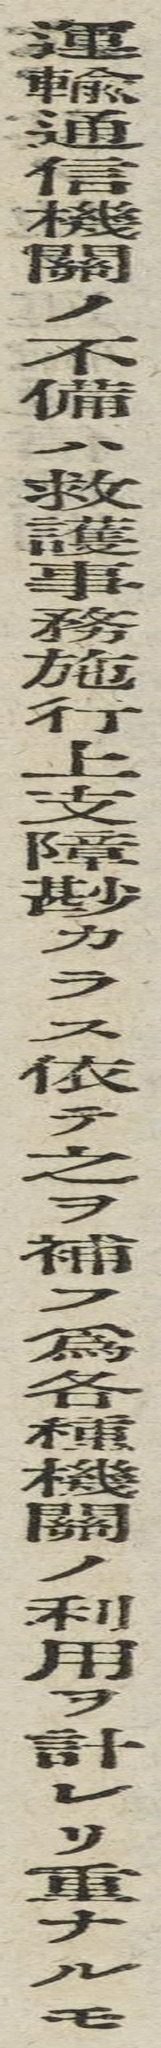運輸通信ノ不備ハ救護事務施行上支障少カラス依テ之ヲ補フ為各種機関ノ利用ヲ計レリ重ナルモ
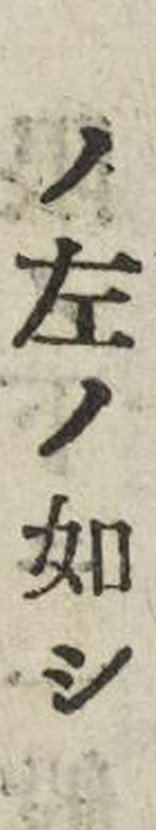ノ左ノ如シ
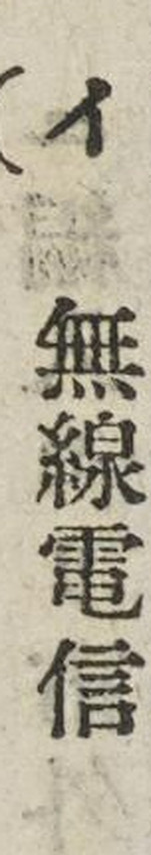無線電信
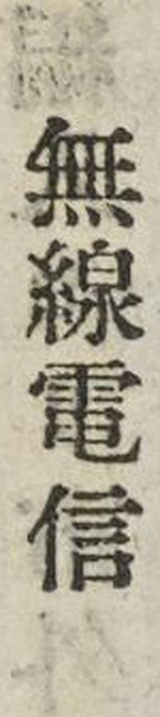無線電信
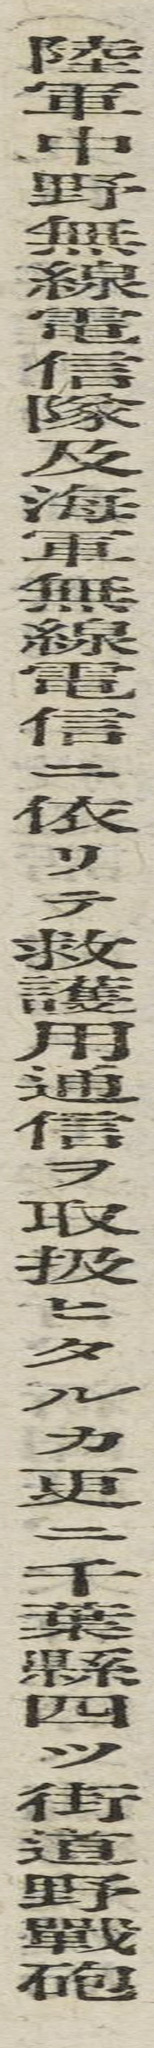陸軍中野無線電信隊及海軍無線電信ニ依リテ救護用通信ヲ取扱ヒタルカ更ニ千葉県四ツ街道野戦砲
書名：震災被害状況並救護施設概要
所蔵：東京大学地震研究所図書室 Earthquake Research Institute Library, The University of Tokyo, JAPAN
